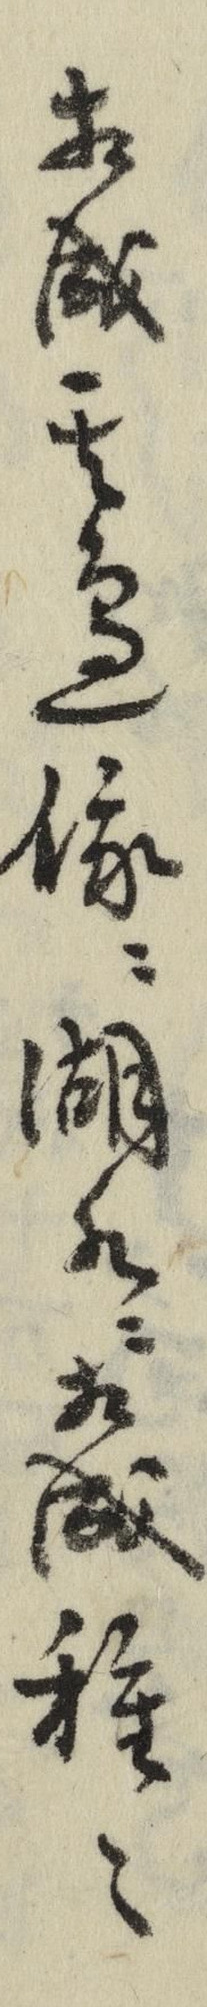相成其辺俄二湖水二相成程之
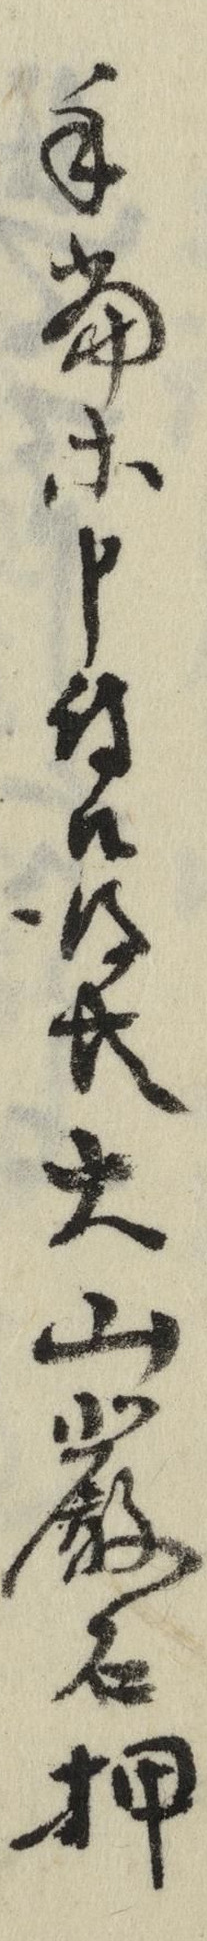手当等申付候得共大山巌石押
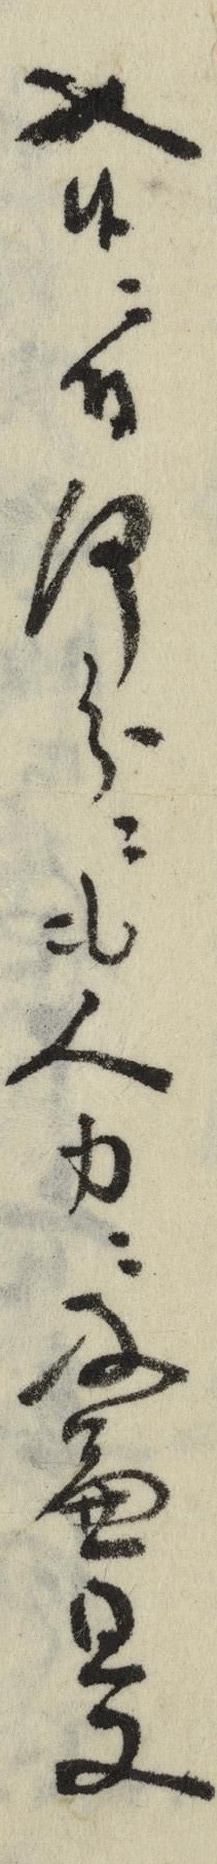入候二付何分二も人力二及兼且又
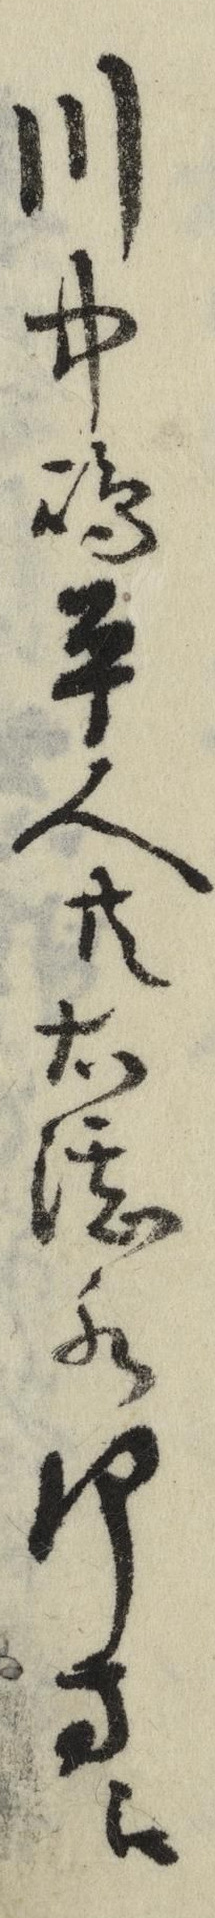川中嶋平人共右湛水何方江
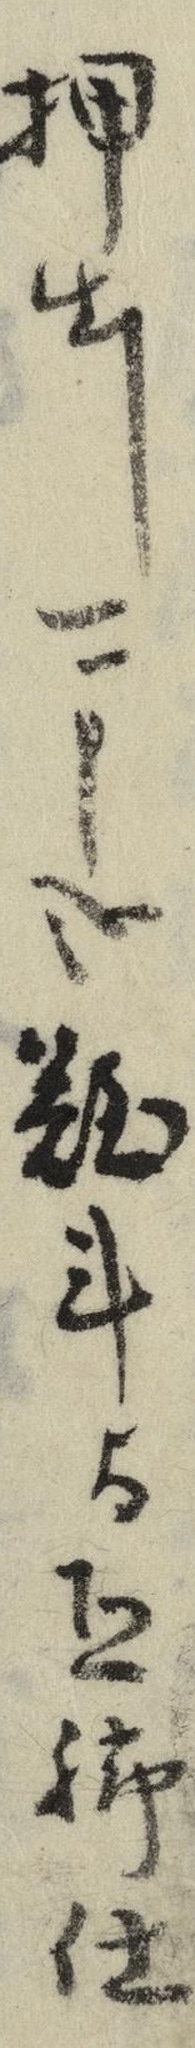押出し可申哉難計と恐怖仕
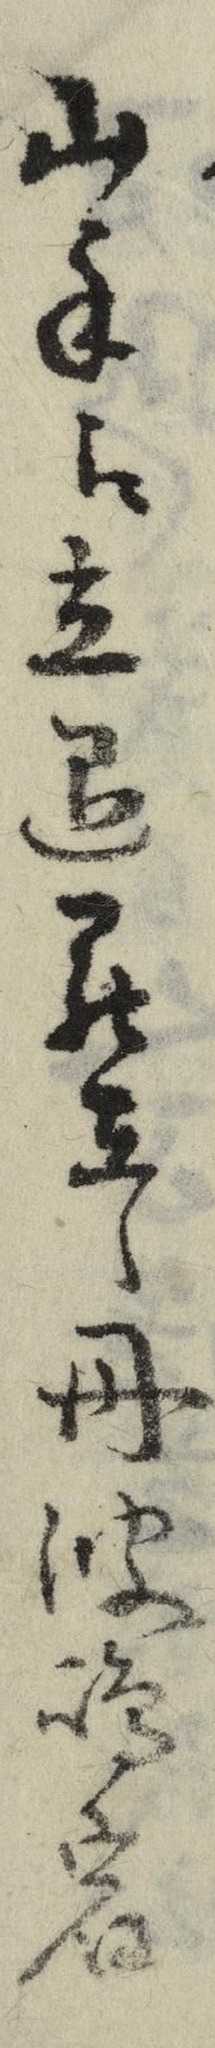山手江立退罷在候丹波嶋宿

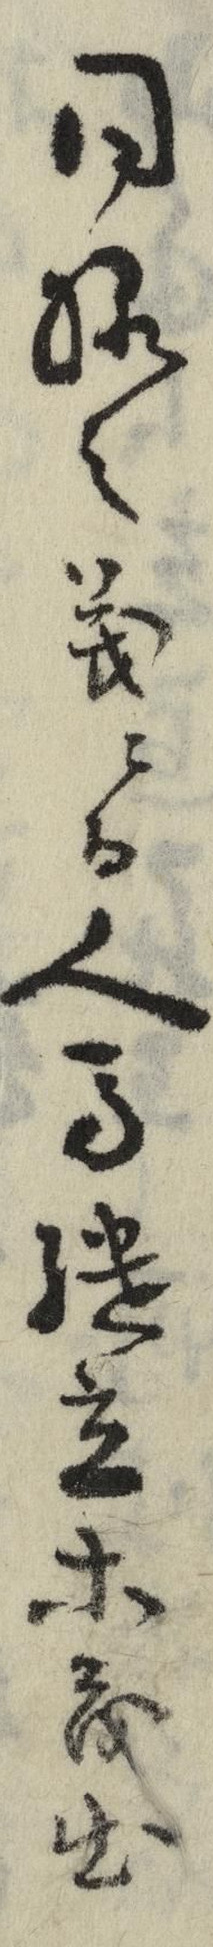同様之義二而人馬継立等も出
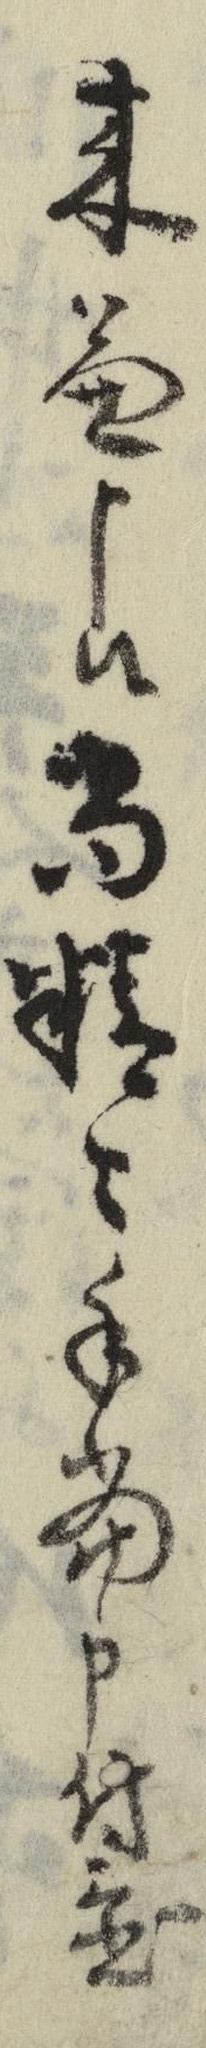来兼申候尚精々手当申付置
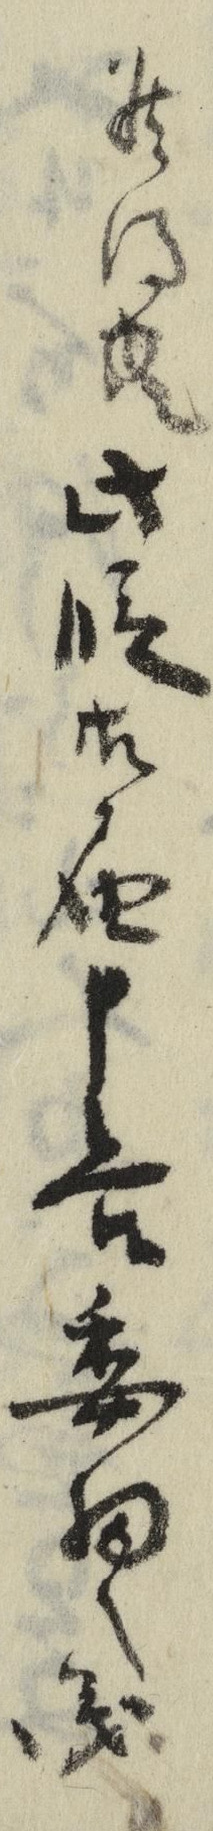候得共此段御届申上候委細之義ハ
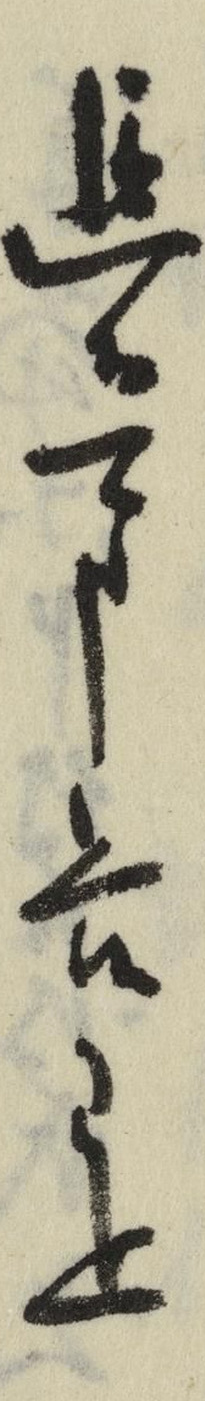追而可申候已上
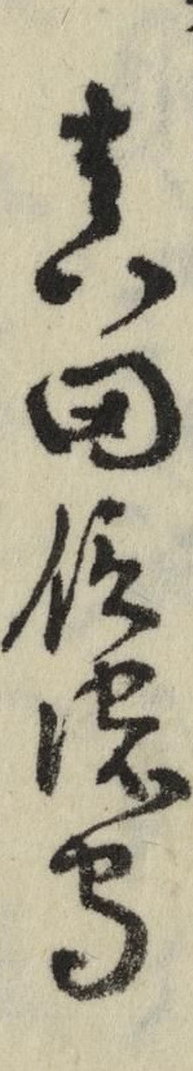真田信濃守
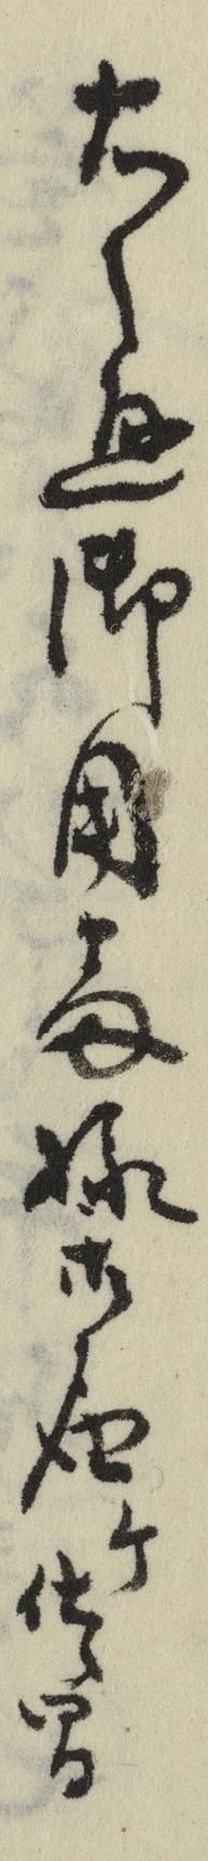右之通御用番様御届ヶ仕候間
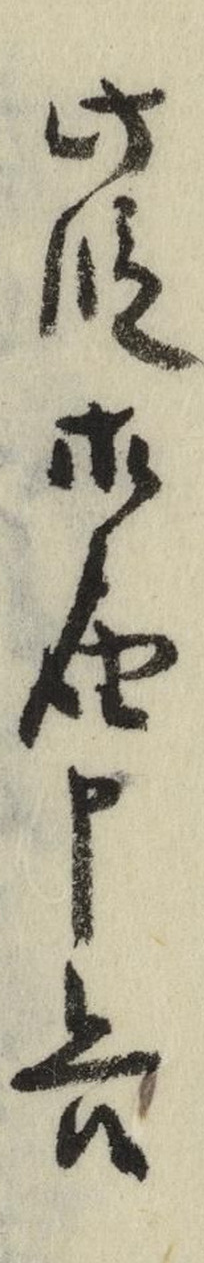此段御届申上候
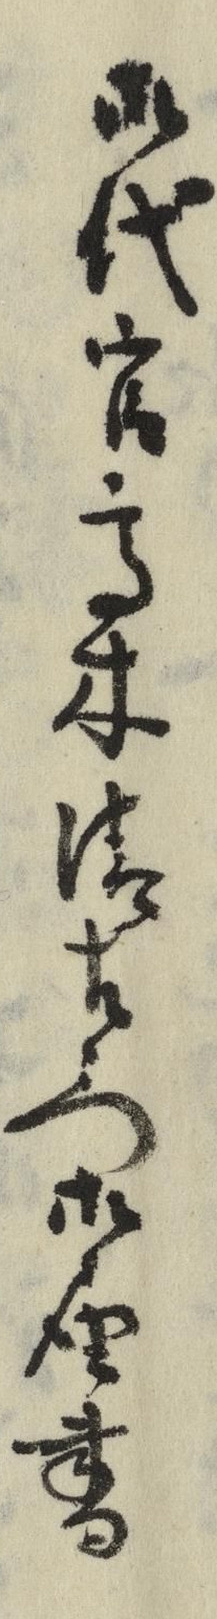御代官高木清左衛門御届書
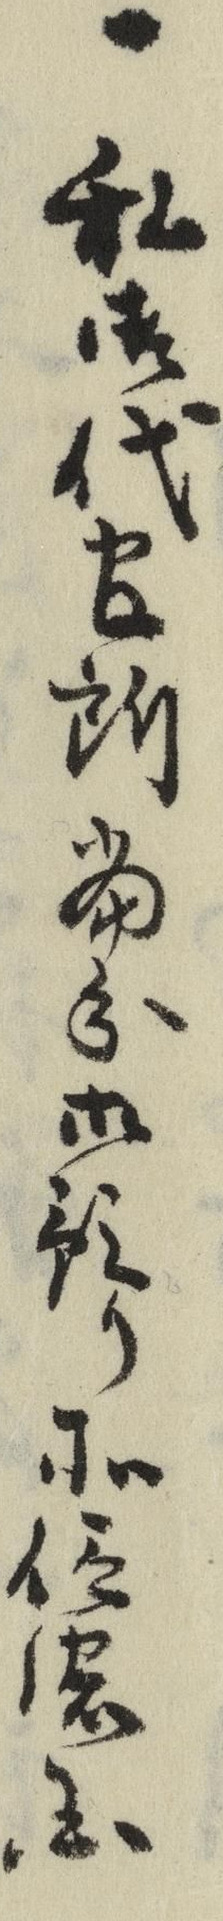私御代官所当分御預り所信濃国
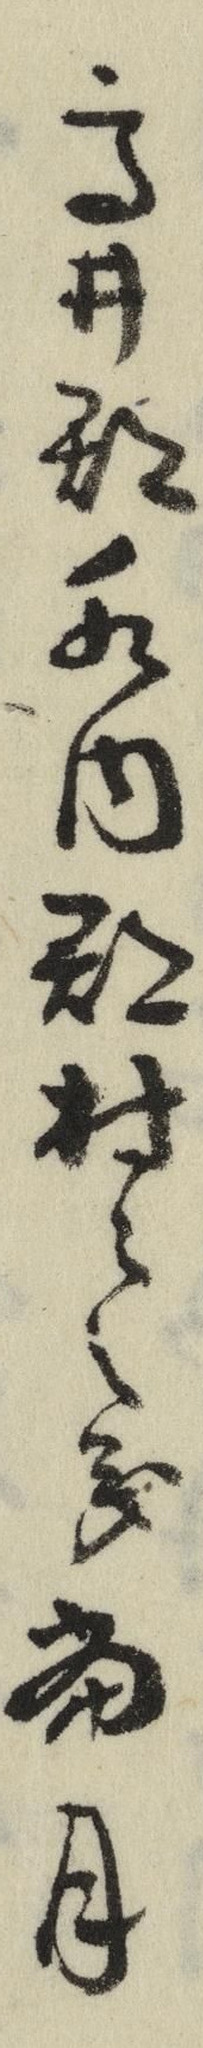高井郡水内郡村々之義当月
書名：信州大地震一件之冩　丁未弘化四年三月吉日
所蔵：東京大学地震研究所図書室 Earthquake Research Institute Library, The University of Tokyo, JAPAN
